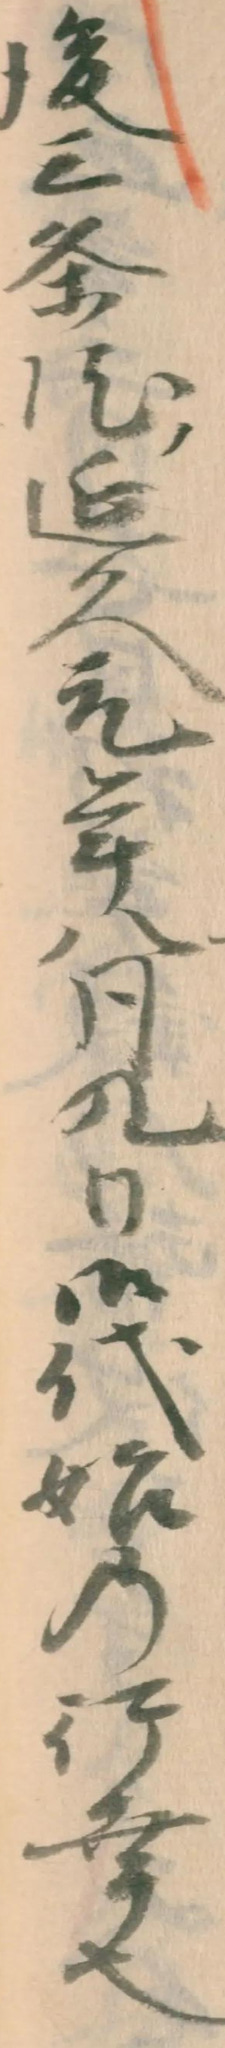後三条院延久元年八月九日御代始の行幸也
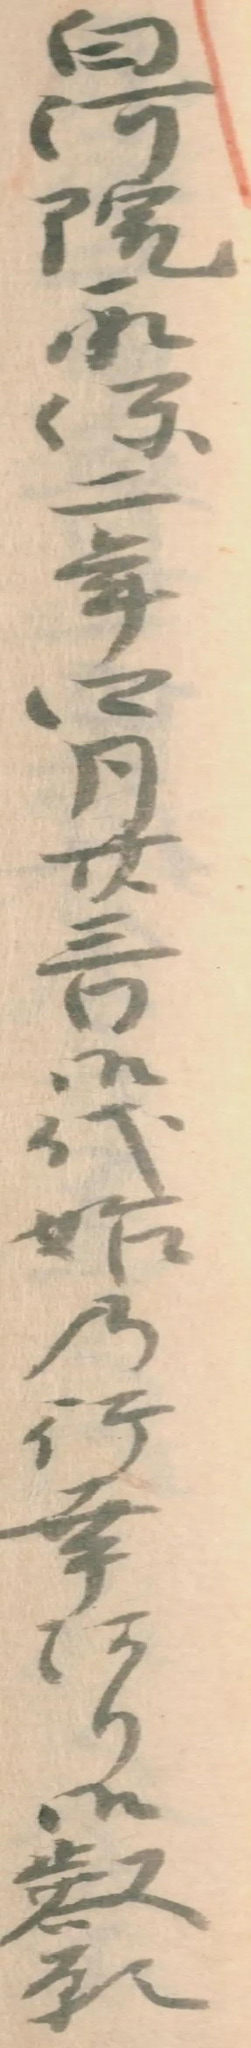白河院承保二年四月廿三日御代始の行幸あり御叡願
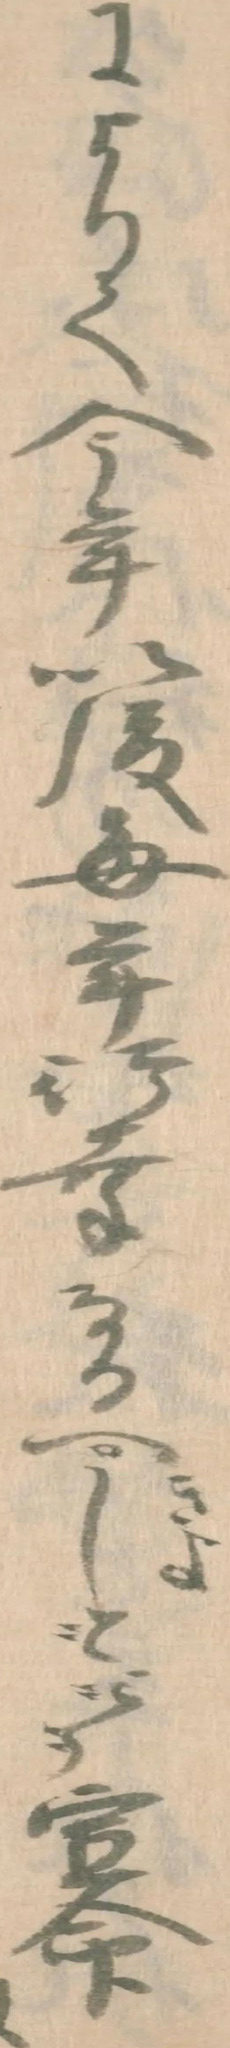によりて今年以後毎年行幸なるへ◦しと云々宣命に
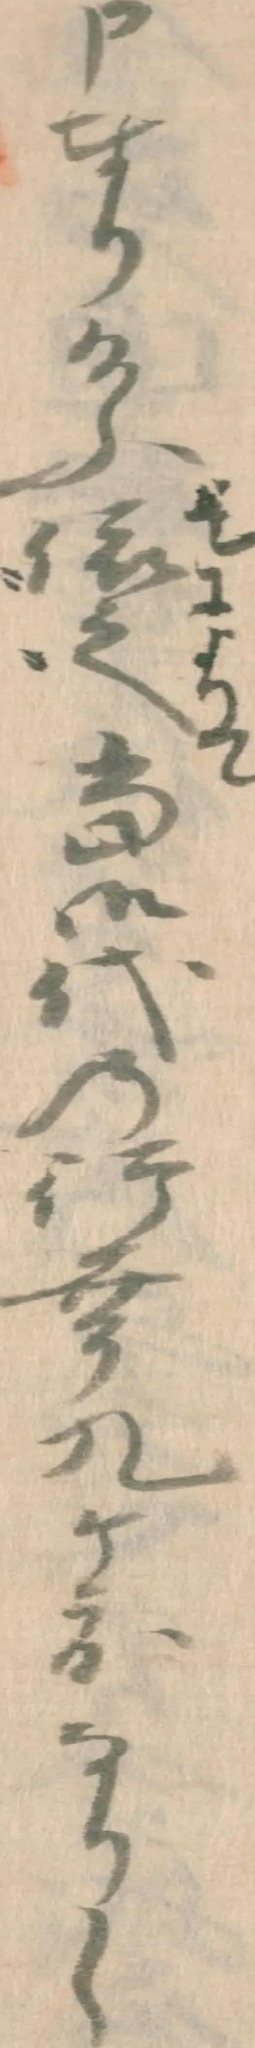申奉り給ふ依之当御代の行幸九ケ度なりし
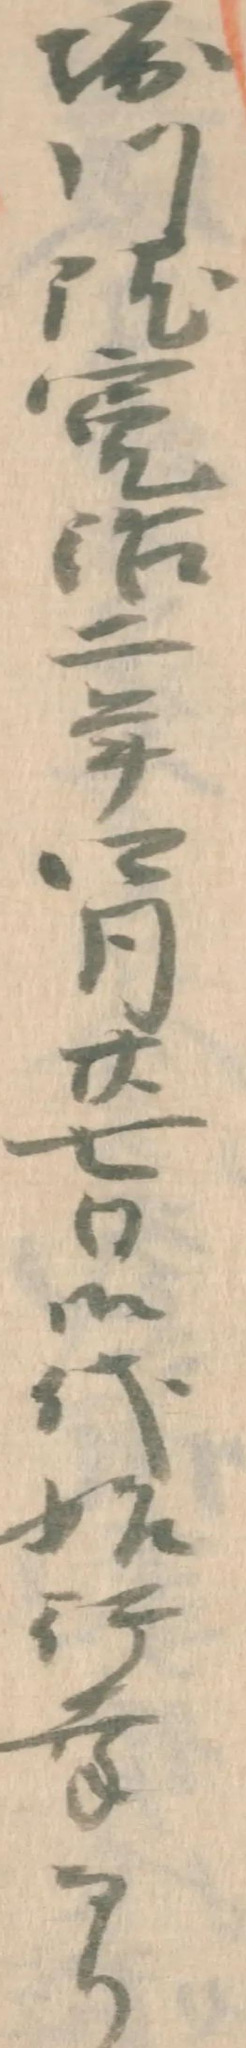堀川院寛治二年四月廿七日御代始行幸なり
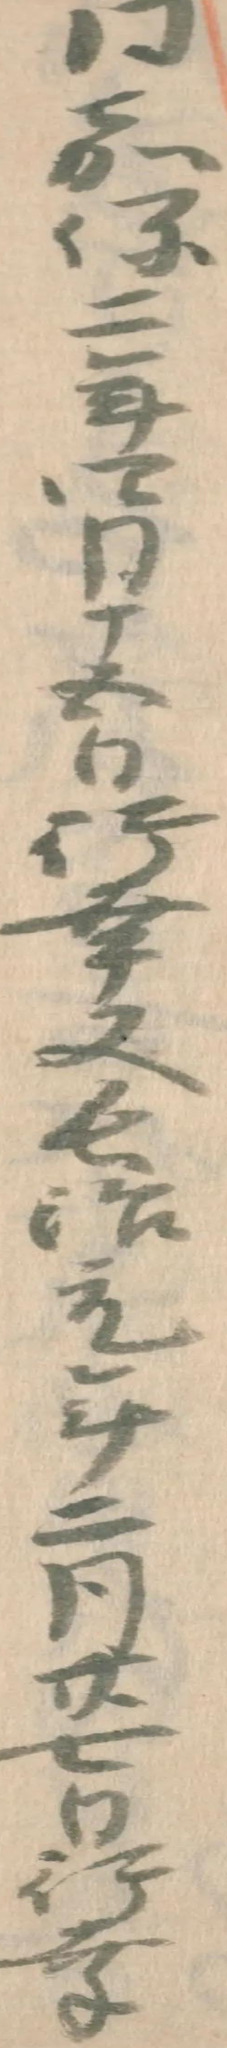同嘉保二年四月十五日行幸又長治元年二月廿七日行幸
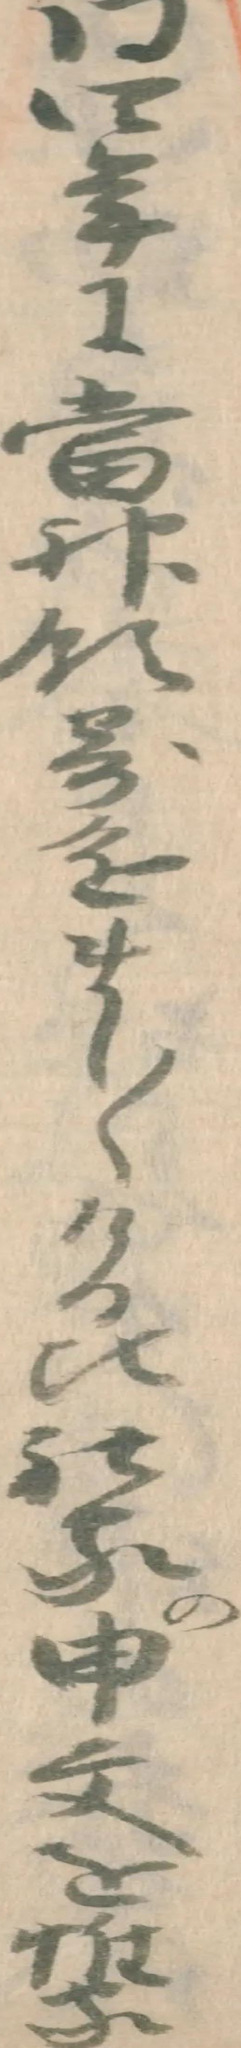同四年に當神領寄進まし〳〵ける比社家申文を惟家
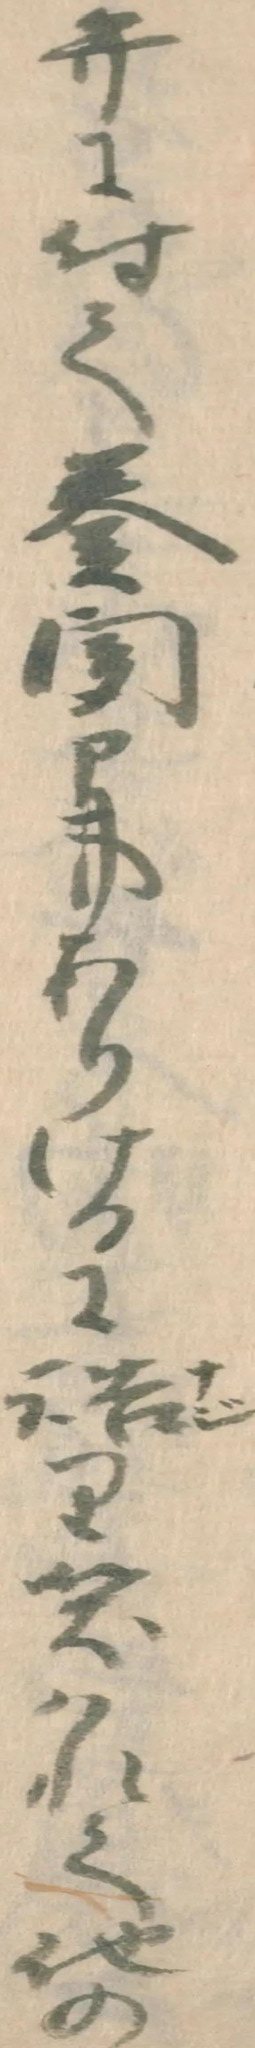弁に付て奏聞申事ありけるに誥り笑はれて他の
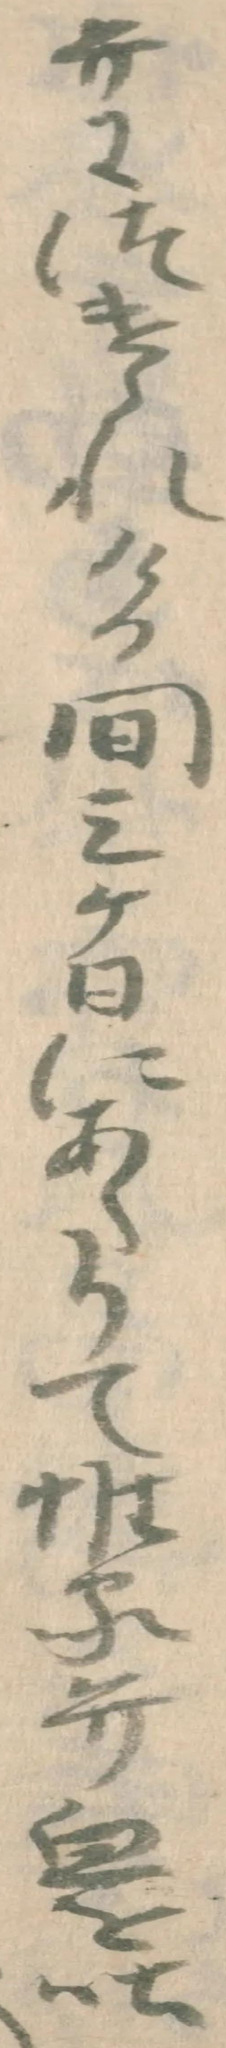弁につけられける間三ヶ日にあたりて惟家弁血を吐て
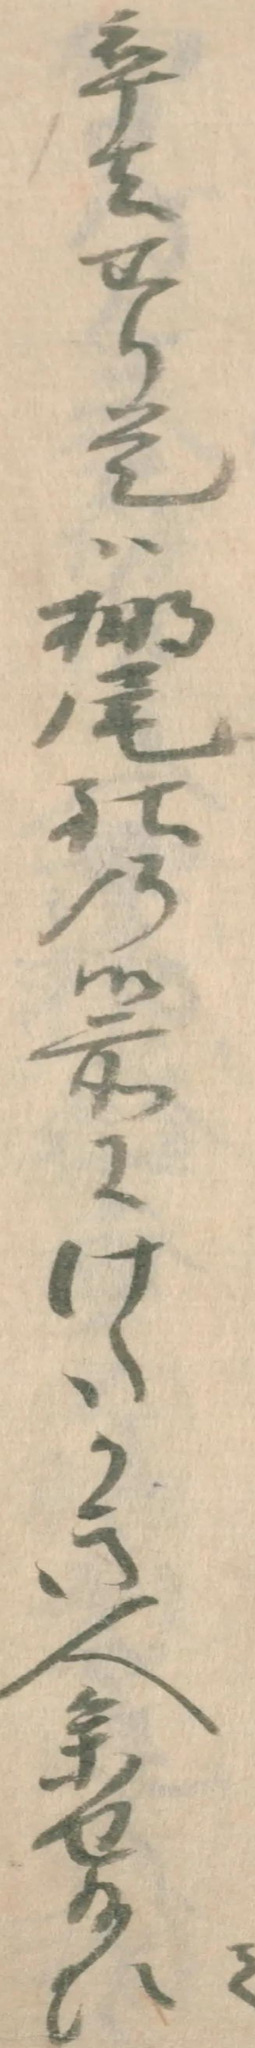卒去せり是は棚尾社の御前にけたかき人参せ給ひ
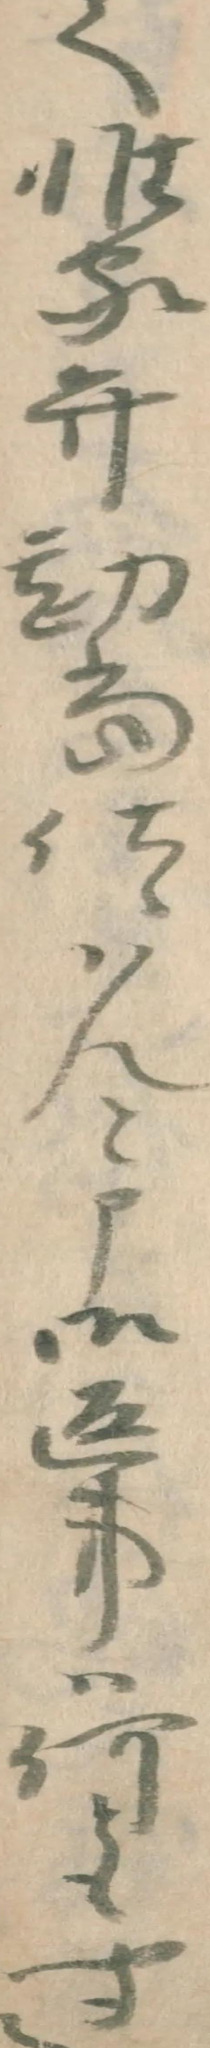て惟家弁勘当仕候はんと申御返事は何とも聞え

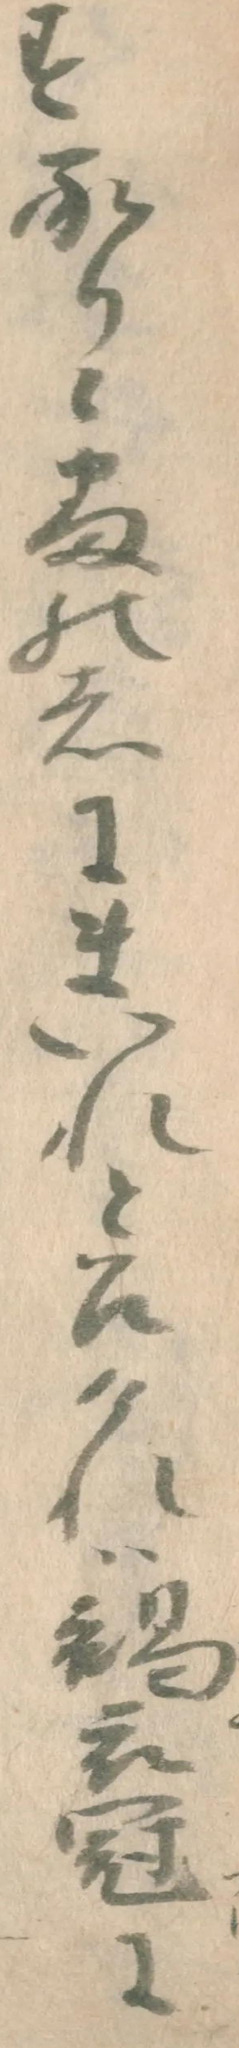す承り候番の者にまいれと召けれは褐衣冠
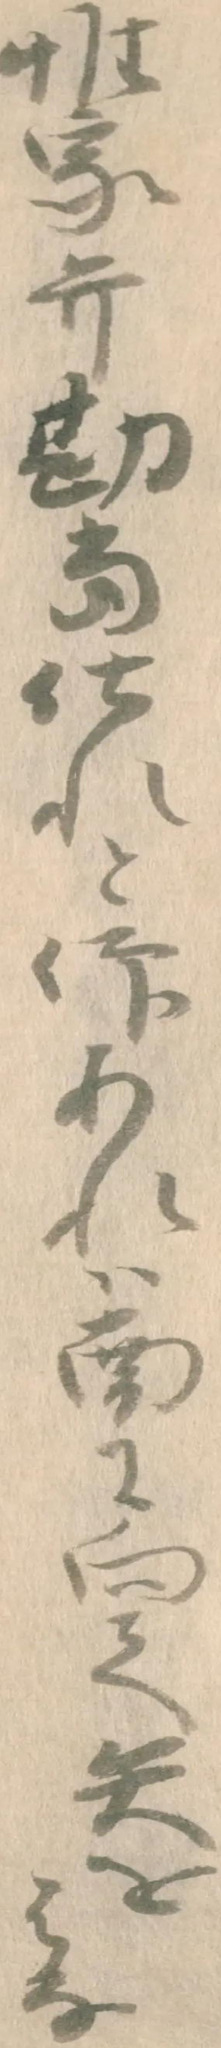惟家弁勘当仕れと仰あれは南に向て矢をはな
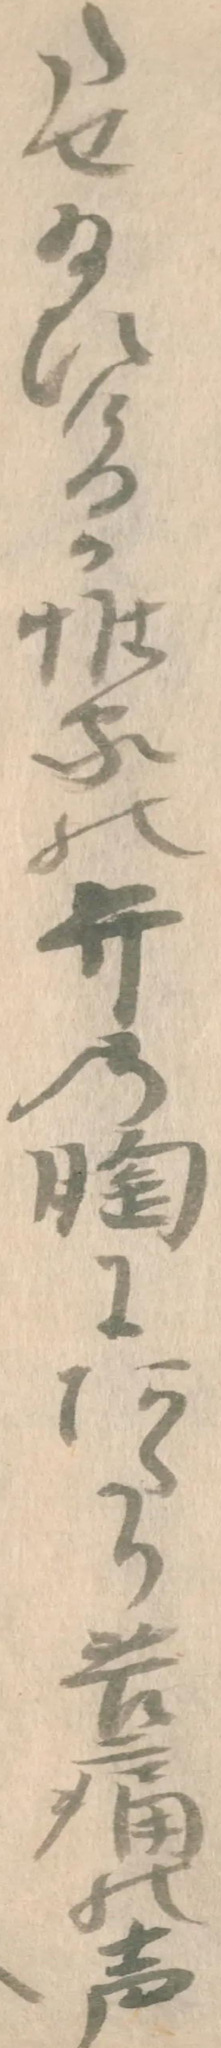たせ給ひけるか惟家の弁の胸にあたり苦痛の声
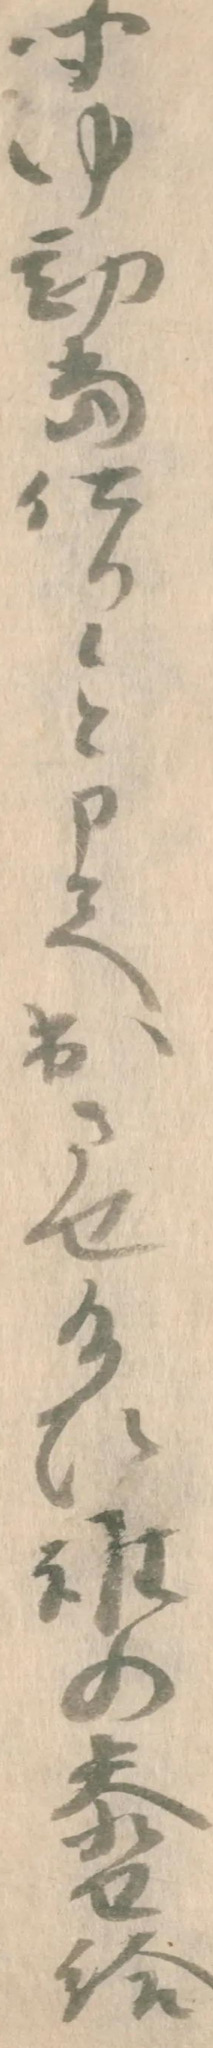聞ゆ勘当仕り候と申て出させ給ひ誰の参せ給
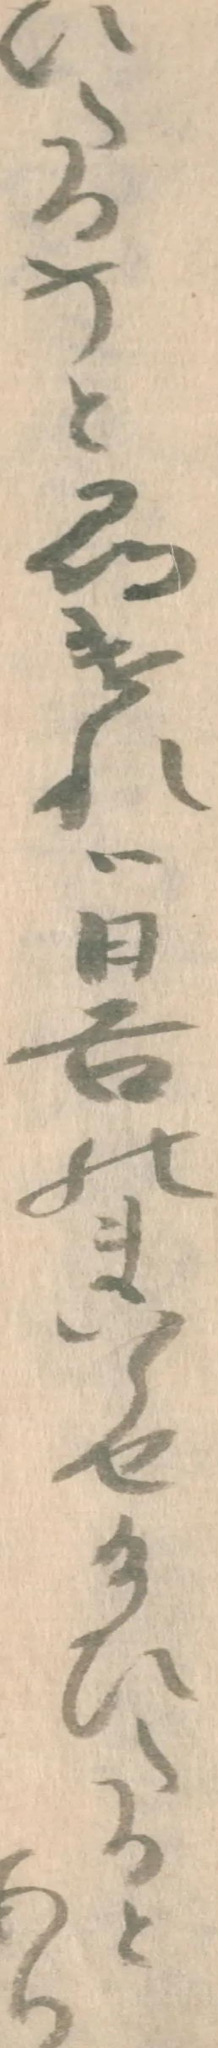ひたるそと尋けれは日吉のまいらせ給ひたるとあり
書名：賀茂社記録. 第1冊
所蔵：国立国会図書館 National Diet Library, JAPAN
